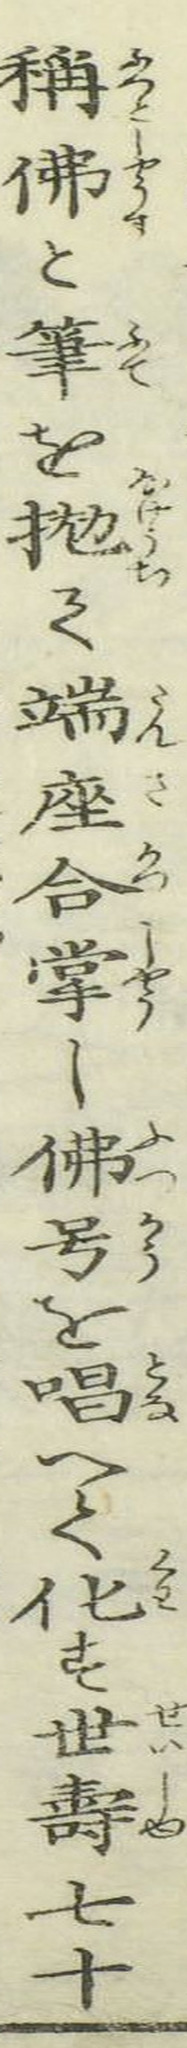称佛と筆を抛て端座合掌し佛号を唱へて化す世壽七十
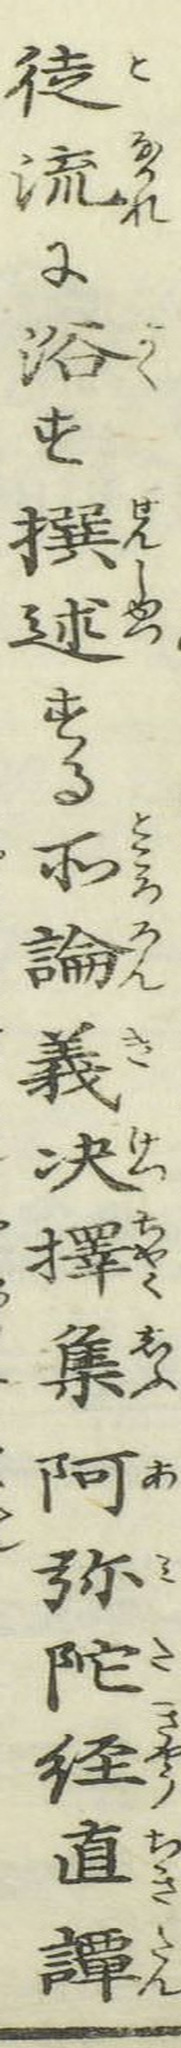徒流に浴す撰述する所論義決擇集阿弥陀経直譚

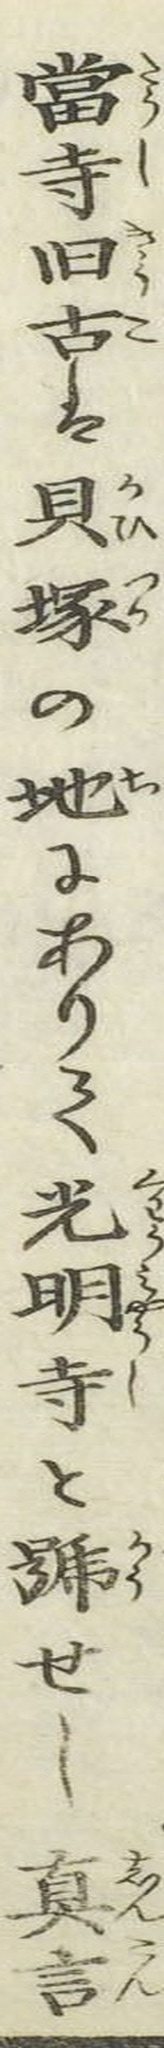當寺旧古は貝塚の地にありて光明寺と号せし真言
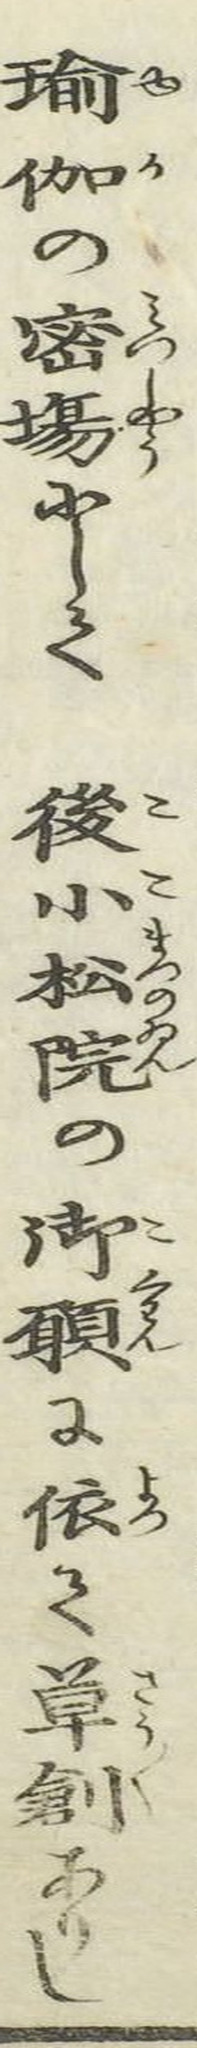瑜伽の密場にして後小松院の御願に依て草創ありし
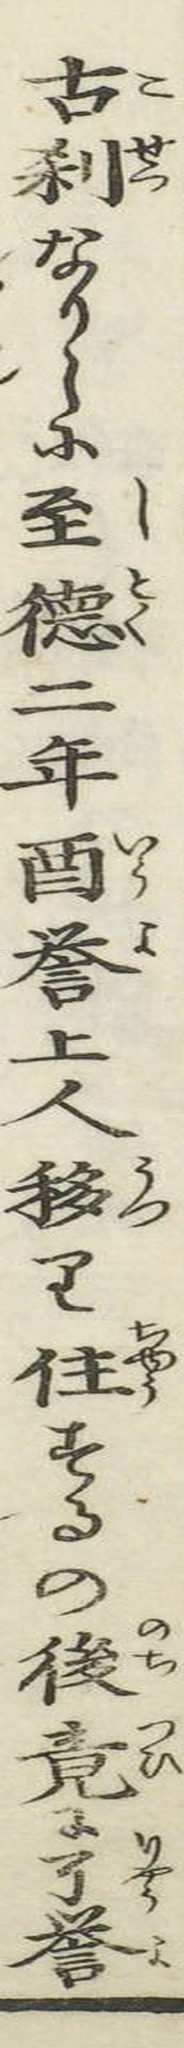古刹なりしに至徳二年酉誉上人移り住するの後竟に了誉
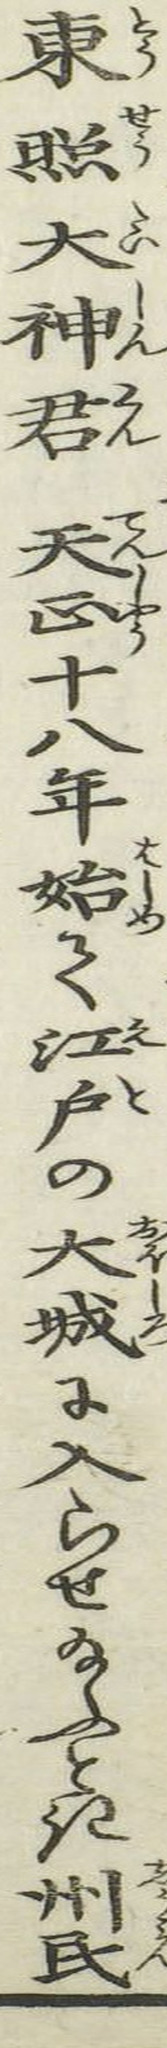東照大神君天正十八年始て江戸の大城に入らせ給ふとき州民
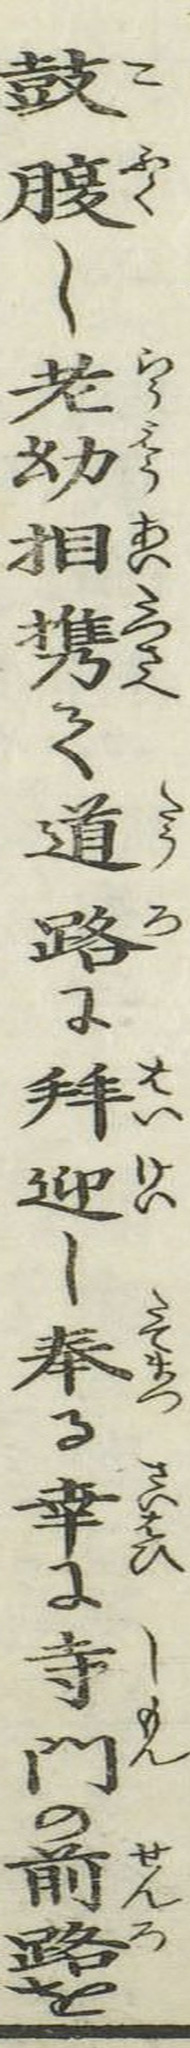鼓腹し老幼相携て道路に拝迎し奉る幸に寺門の前路を
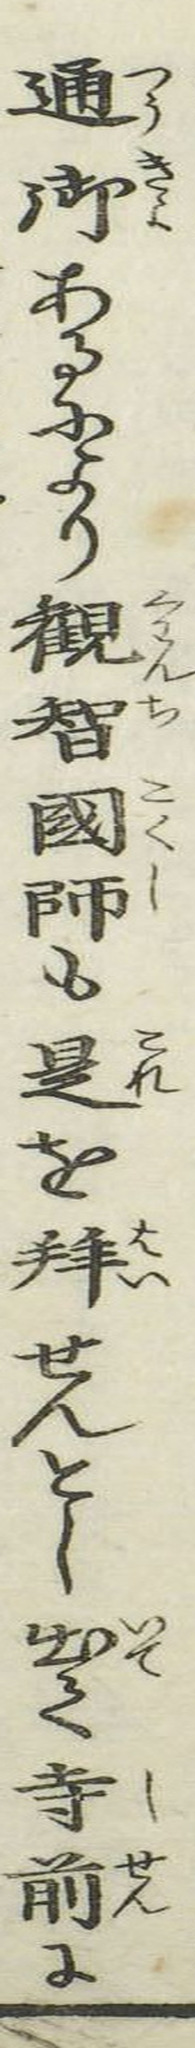通御あるにより観智国師も是を拝せんとし出て寺前に
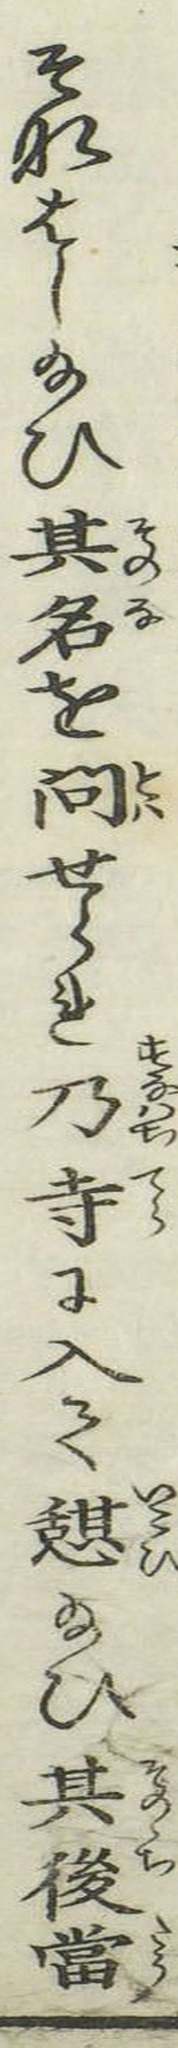そなはし給ひ其名を問せられ乃寺に入て憩給ひ其後當
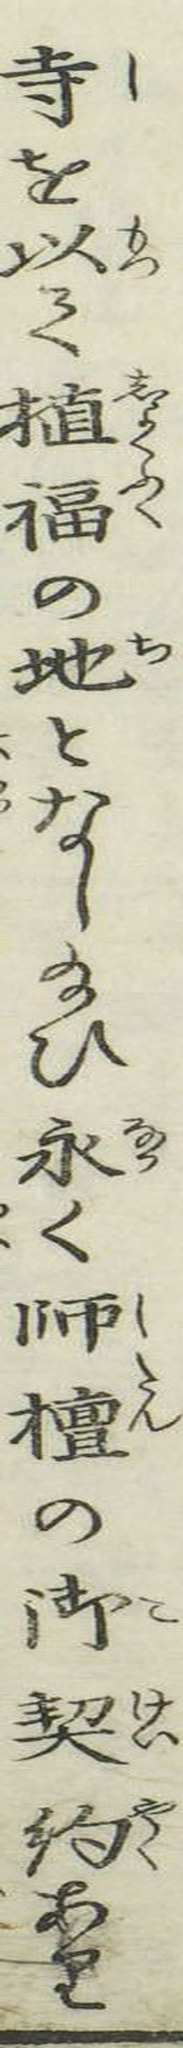寺を以て植福の地となし給ひ永く師檀の御契約あり

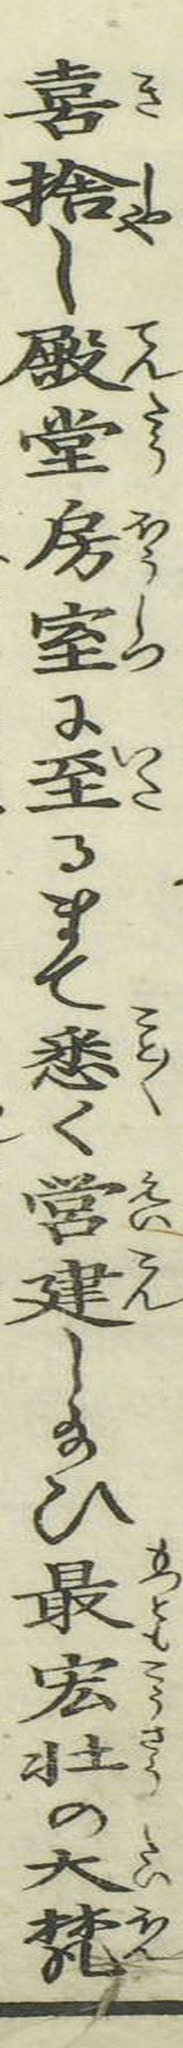喜捨し殿堂房室に至るまて悉く営建し給ひ最宏壮の大梵
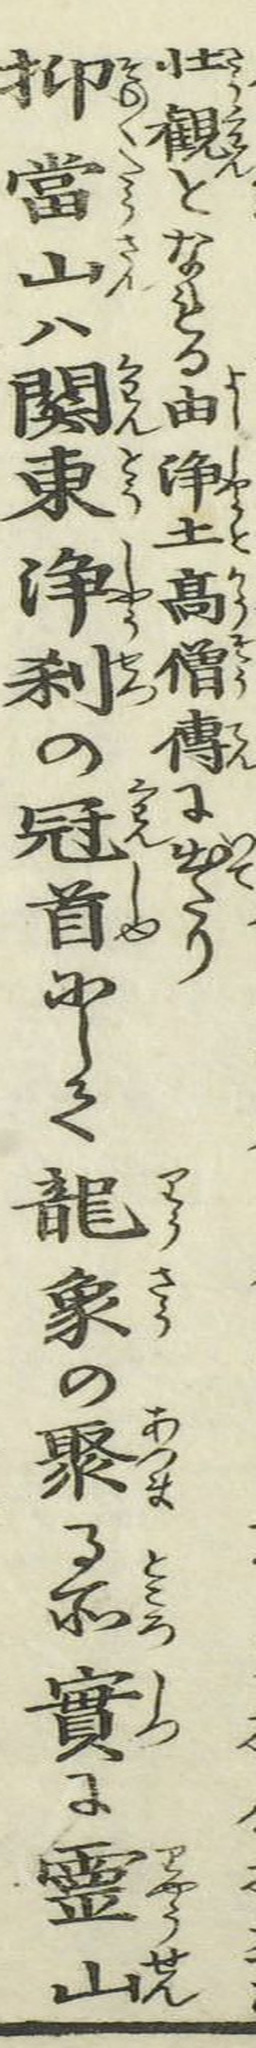抑當山は関東浄刹の冠首にして龍象の聚る所實に霊山
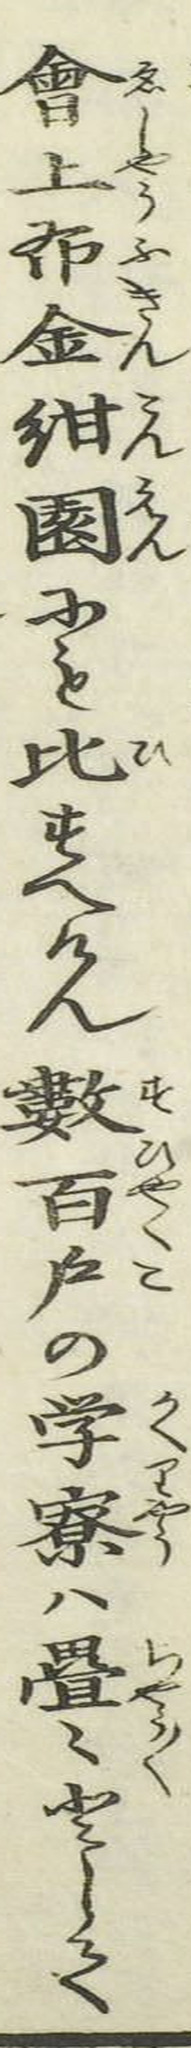會上布金紺園にも比すへけん数百戸の学寮は畳々として
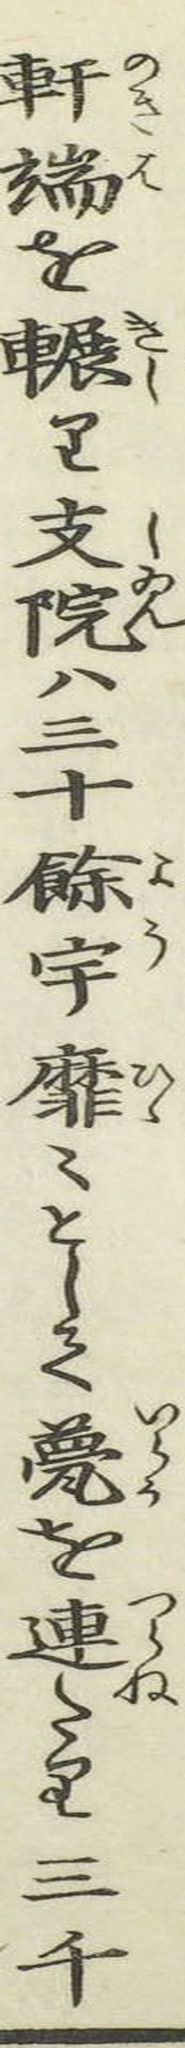軒端を輾り支院は三十餘宇靡々として甍を連たり三千
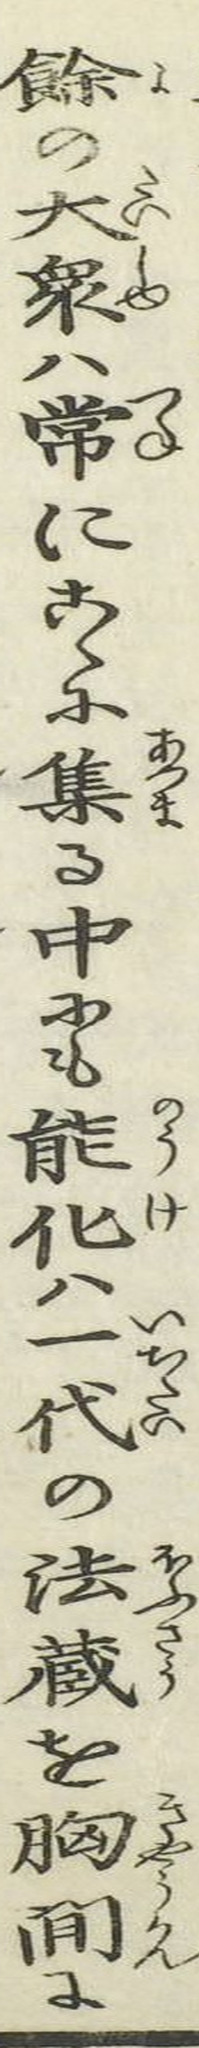餘の大衆は常にこゝに集る中にも能化は一代の法蔵を胸間に
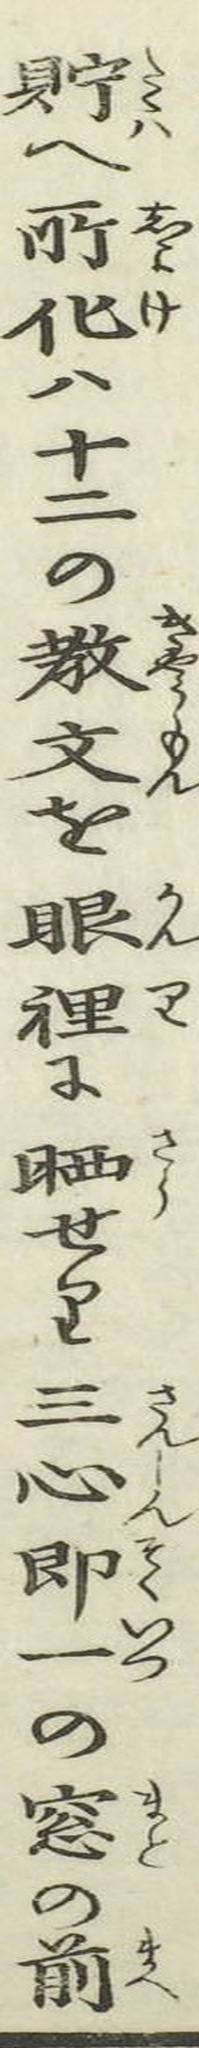貯へ所化は十二の教文を眼裡に晒せり三心即一の窓の前
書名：江戸名所図会 20巻 巻之3
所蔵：東京学芸大学教育コンテンツアーカイブ
